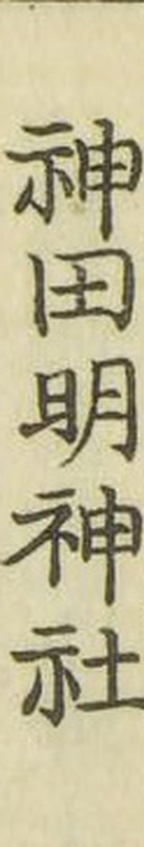神田明神社
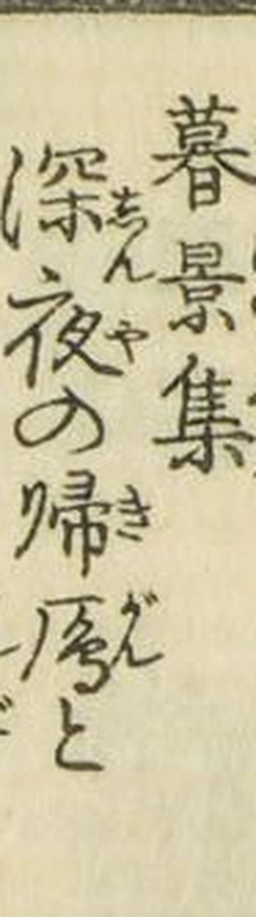深夜の帰雁と
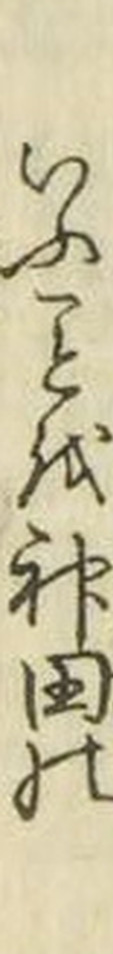いふことを神田の
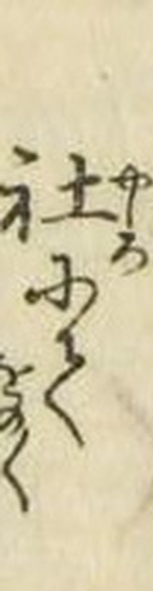社にて
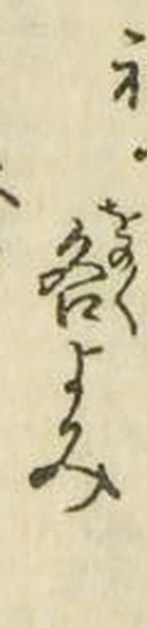各よみ
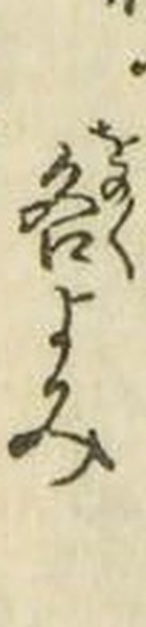各よみ
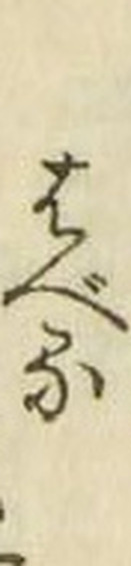はべる
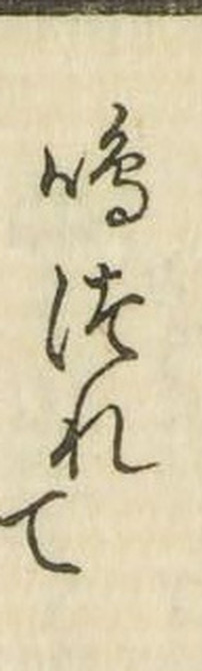鳴つれて
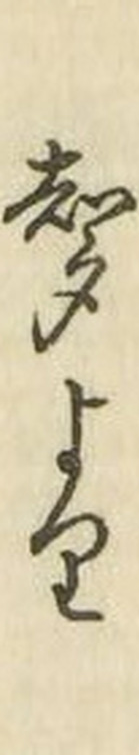声より
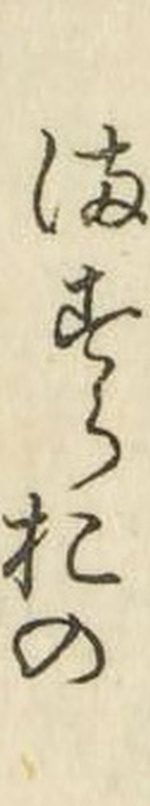ますらおの
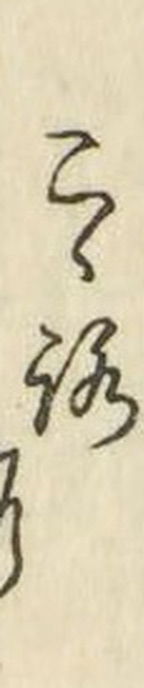こゝろに
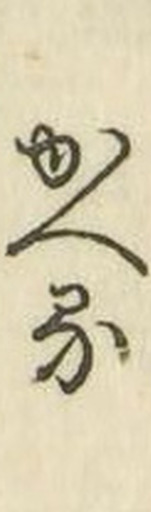かへる
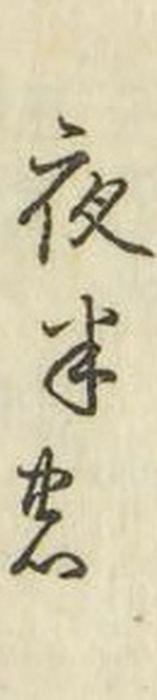夜半の
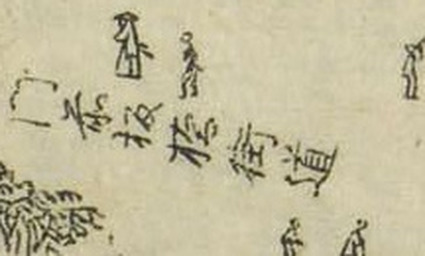門前板橋街道
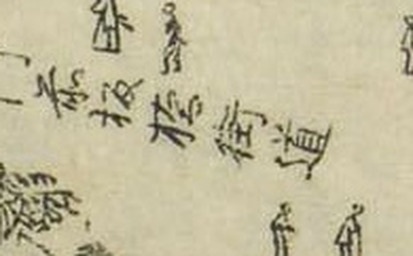門前板橋街道

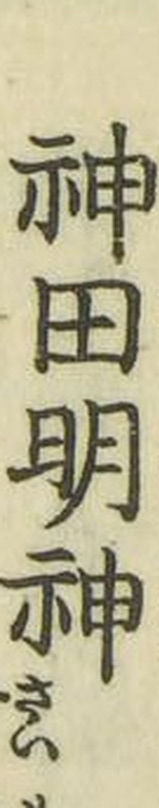神田明神
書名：江戸名所図会 20巻 巻之14
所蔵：東京学芸大学教育コンテンツアーカイブ
